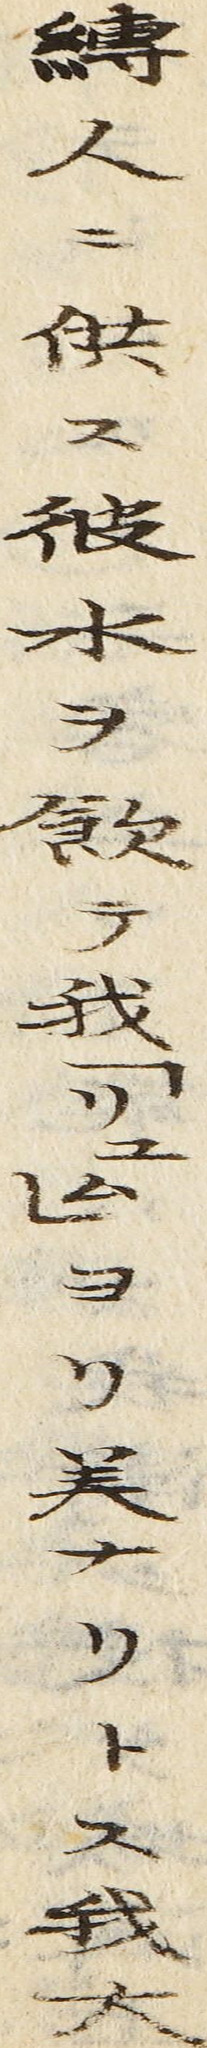縛人ニ供ス彼水ヲ飲テ我「リュム」ヨリ美ナリトス我大
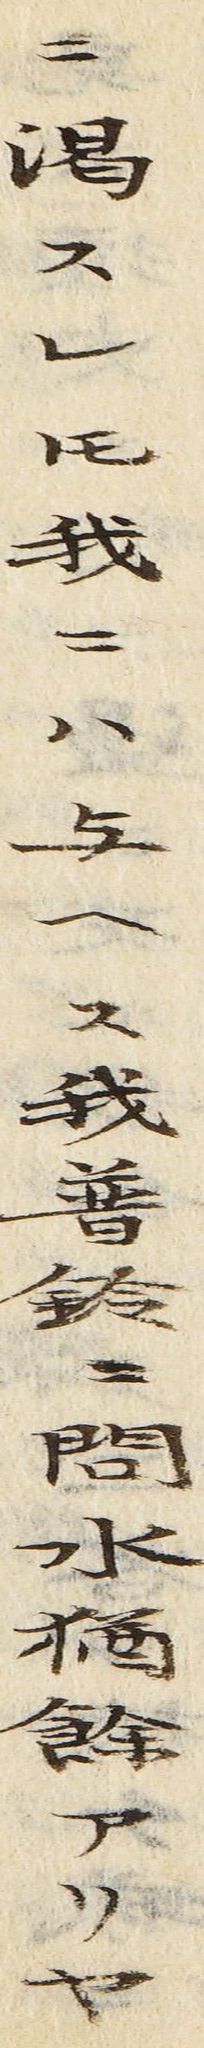ニ渇スレトモ我ニハ与ヘス我普鈴ニ問水猶余アリヤ
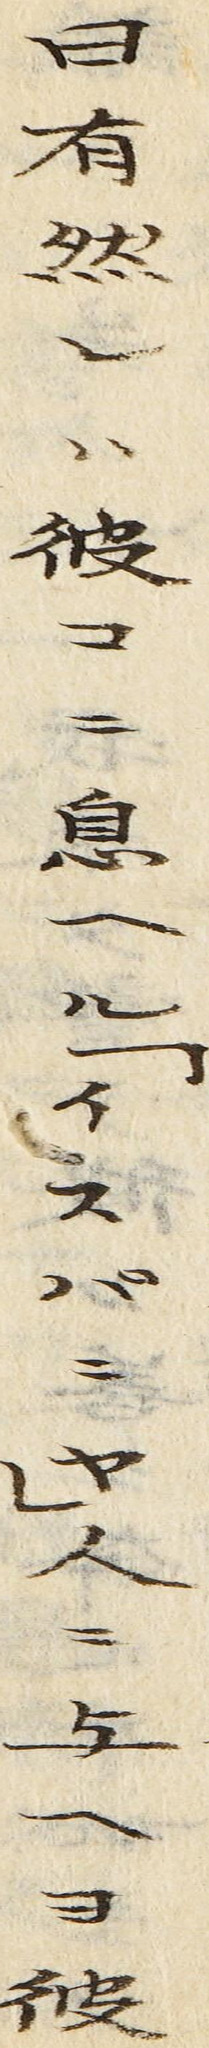曰有然レハ彼コニ息ヘル「イスパニヤ」人ニ与ヘヨ彼
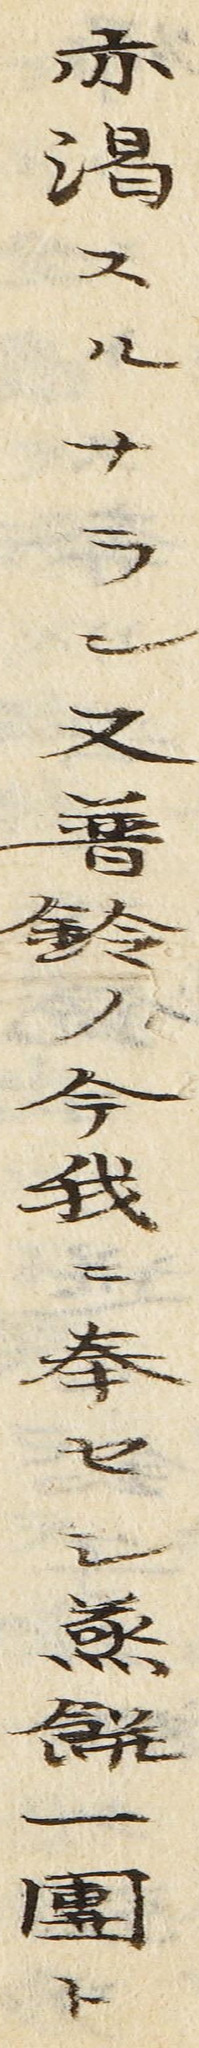亦渇スルナラン又普鈴ノ今我ニ奉セシ蒸餅一団ト
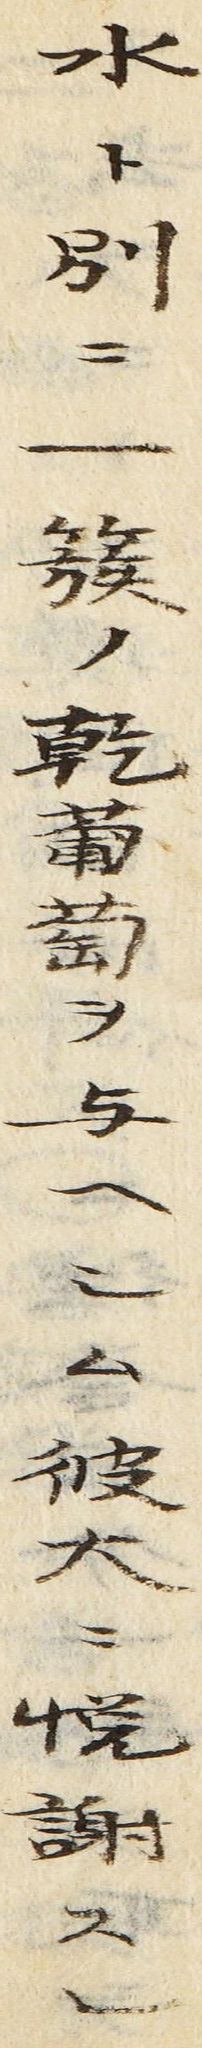水ト別ニ一簇ノ乾葡萄ヲ与ヘシム彼大ニ悦謝スレ
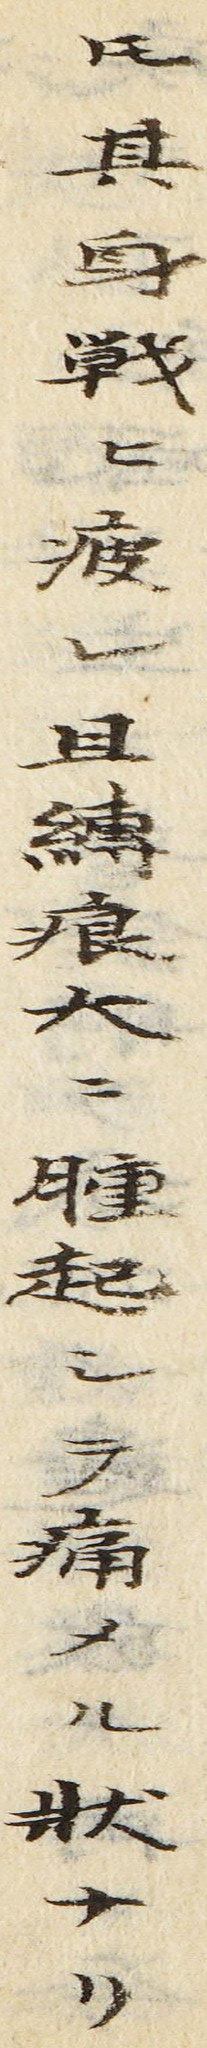トモ其身戦ヒ疲レ且縛痕大ニ腫起シテ痛メル状ナリ
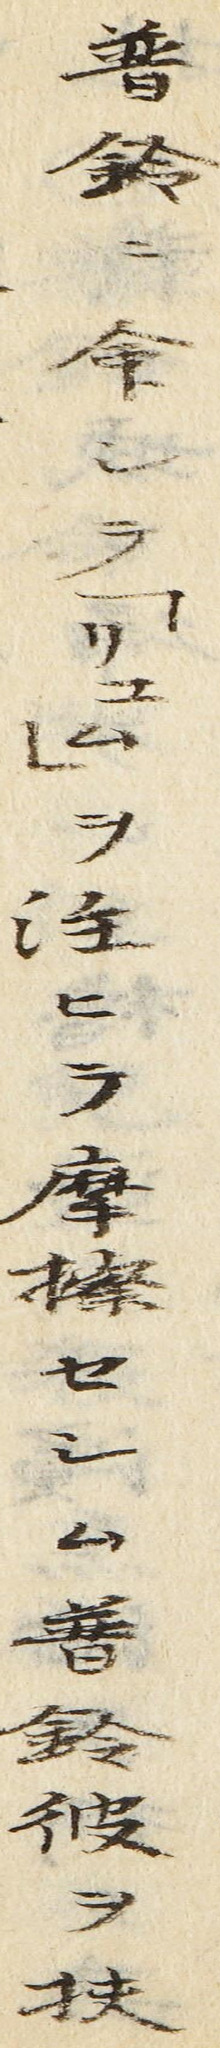普鈴ニ命シテ「リュム」ヲ注ヒテ摩擦セシム普鈴彼ヲ扶
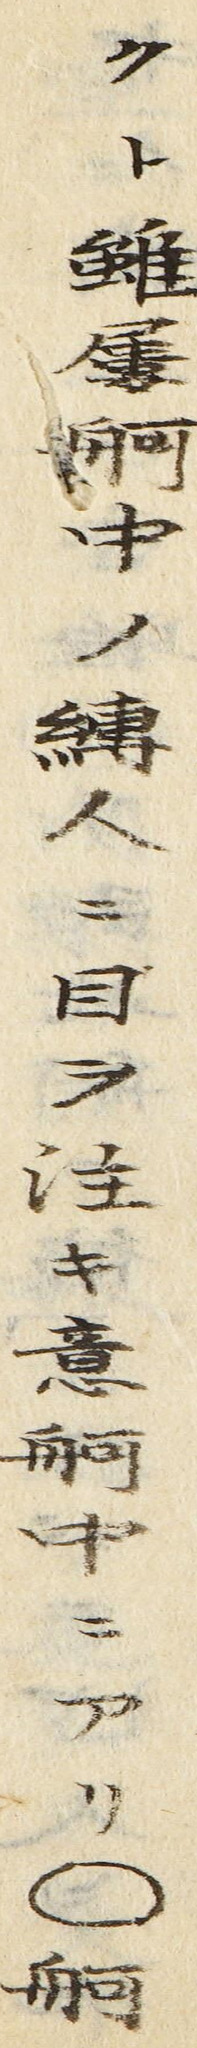クト雖屢舸中ノ縛人ニ目ヲ注キ意舸中ニアリ◯舸

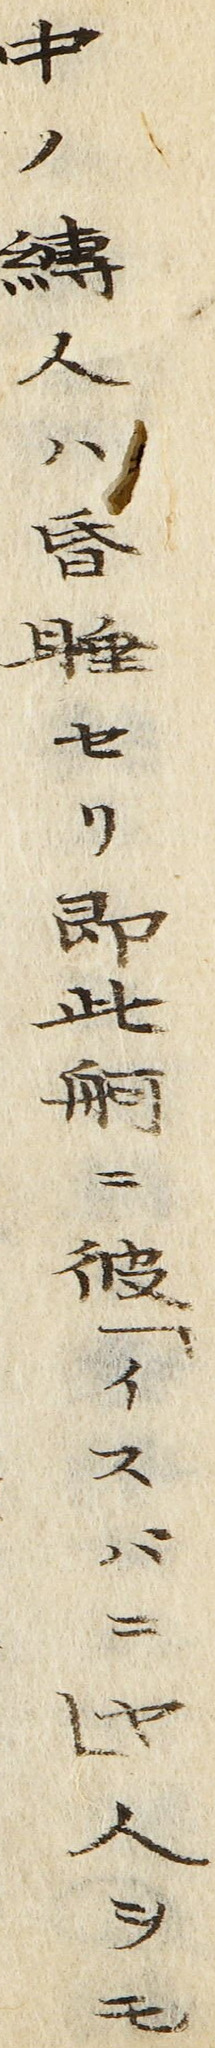中ノ縛人ハ昏睡セリ即此舸ニ彼「イスパニヤ」人ヲモ
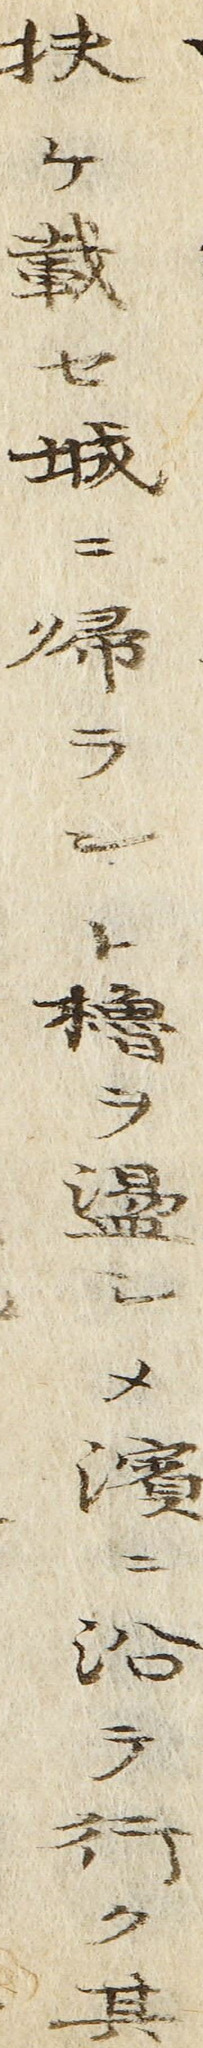扶ケ載セ城ニ帰ラント櫓ヲ盪シメ浜ニ沿テ行ク其
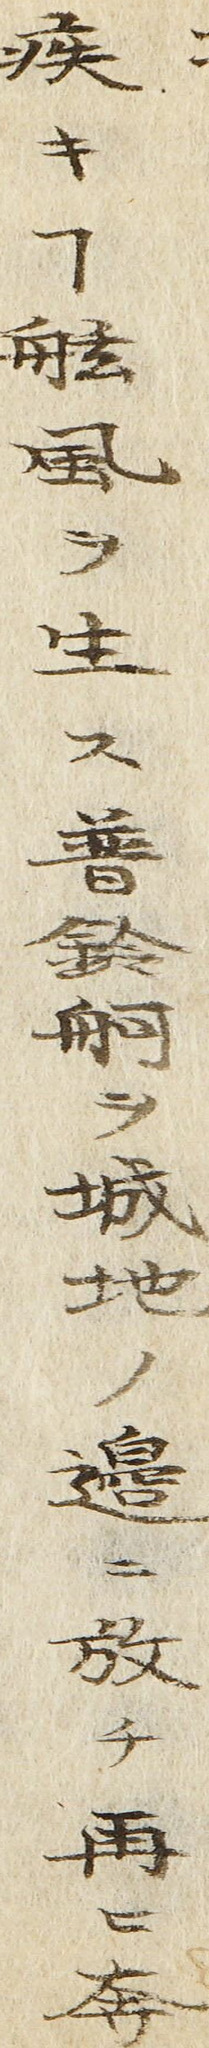疾キコト舷風ヲ生ス普鈴舸ヲ城地ノ辺ニ放チ再ヒ奔
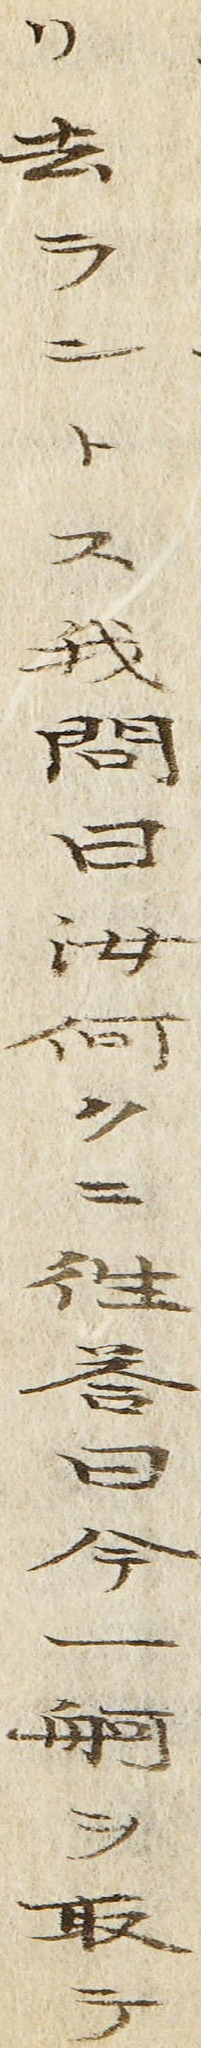リ去ラントス我問曰汝何クニ往答曰今一舸ヲ取テ
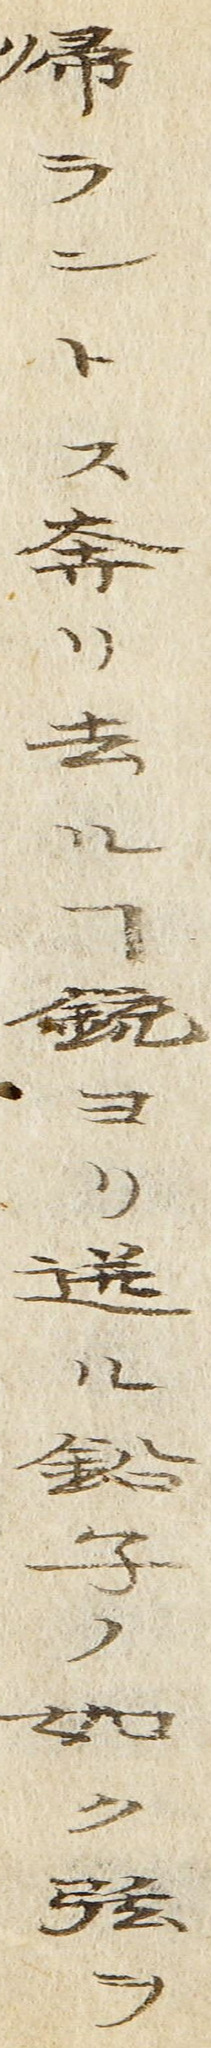帰ラントス奔リ去ルコト銃ヨリ迸ル鉛子ノ如ク弦ヲ
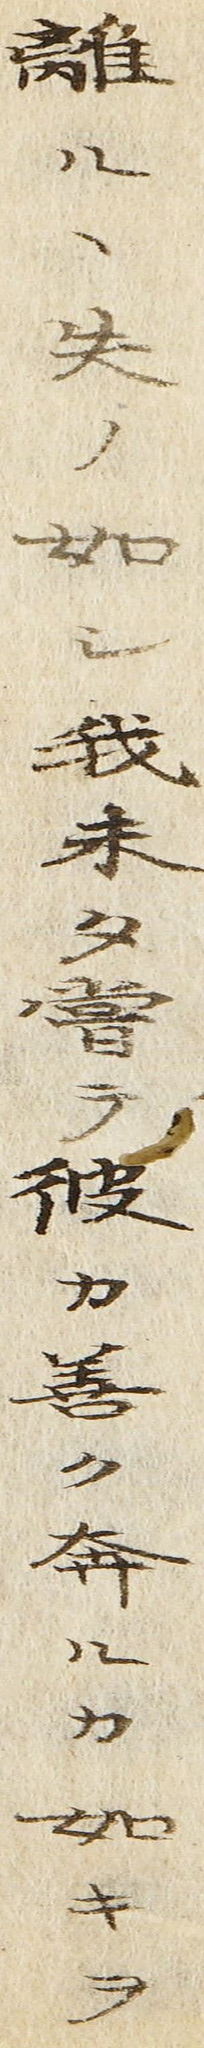離ルヽ矢ノ如シ我未タ嘗テ彼カ善ク奔ルカ如キヲ
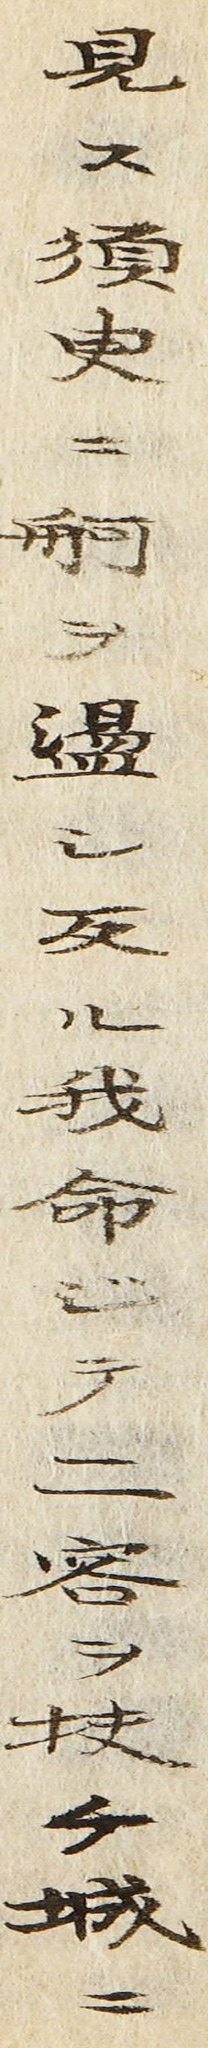見ス須臾ニ舸ヲ盪シ反ル我命ジテ二客ヲ扶ケ城ニ
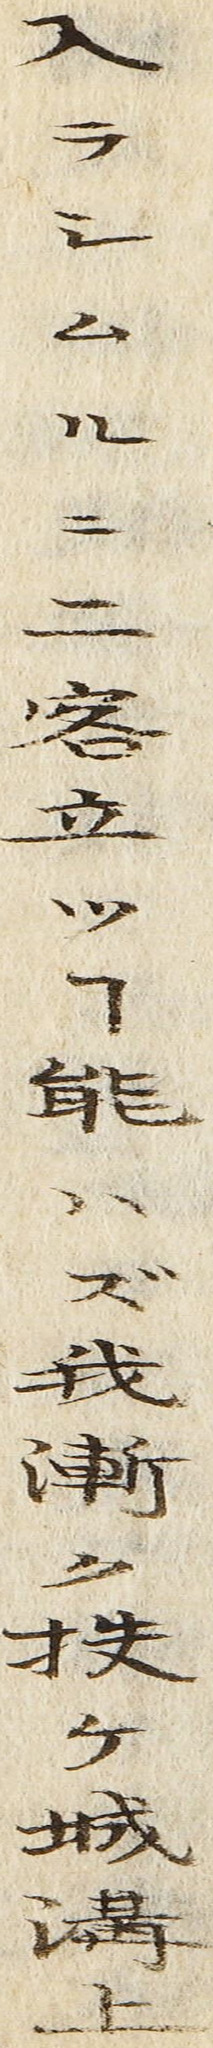入ラシムルニ二客立ツコト能ハズ我漸ク扶ケ城溝上
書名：漂流紀事
